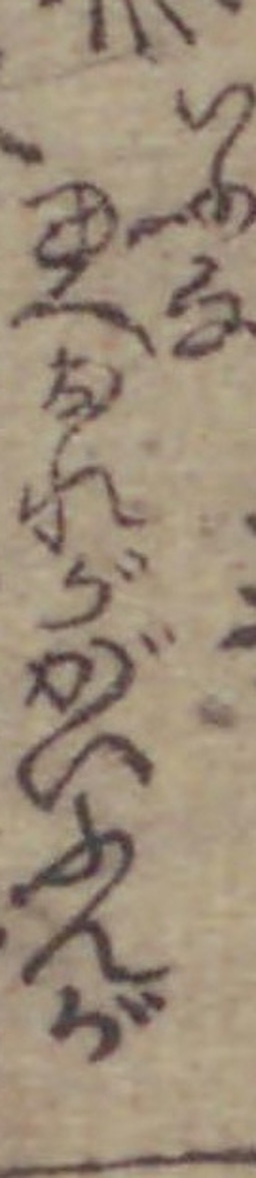ゆへおれががいふんが
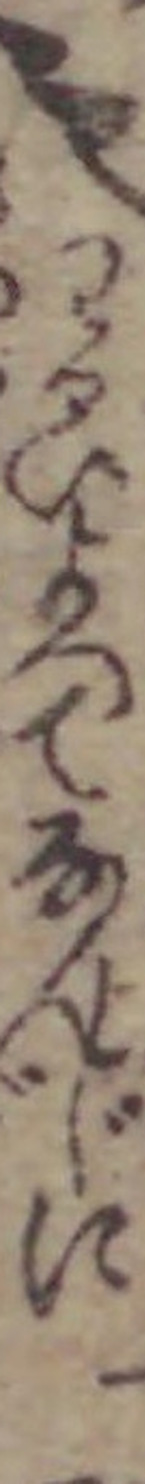わるいよつてなんじに
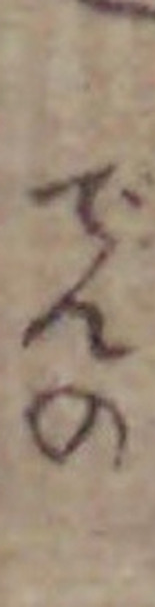でんの
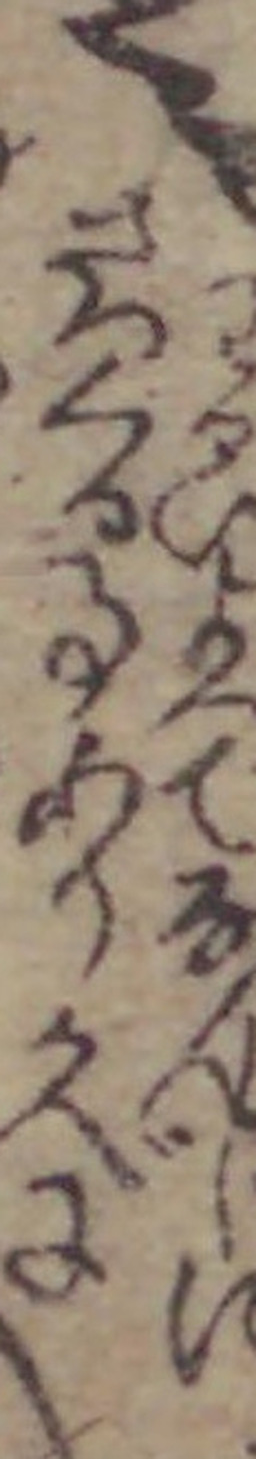さつくる事ありかべに
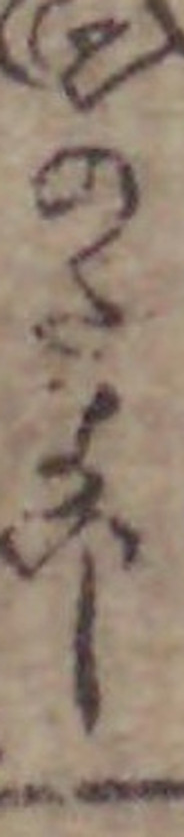のたまいし
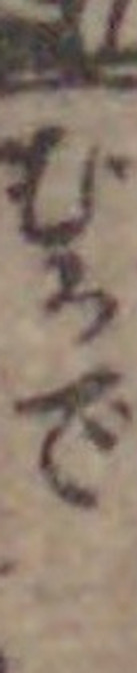むかで
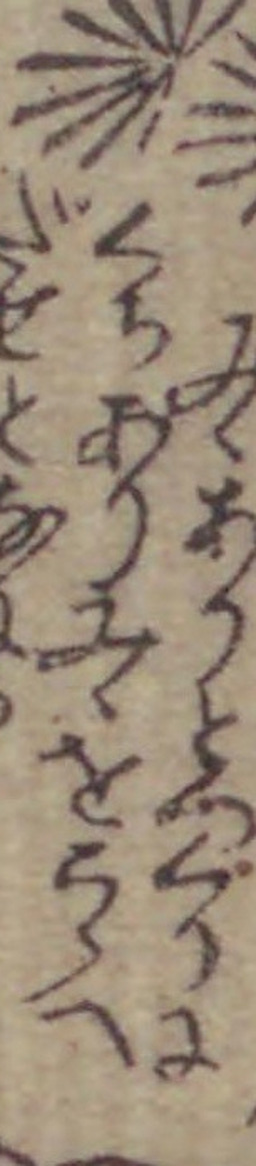くちありみゝをこゝへ
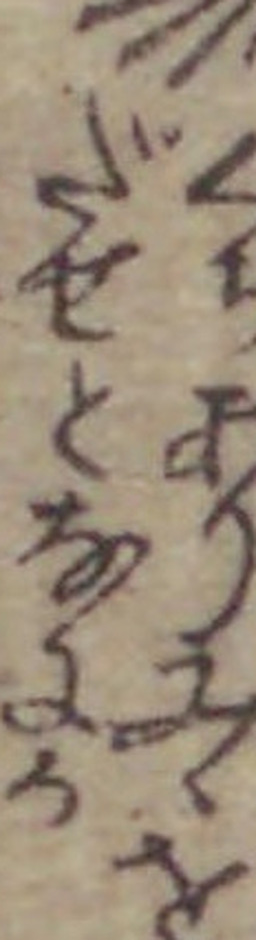だせとなにか
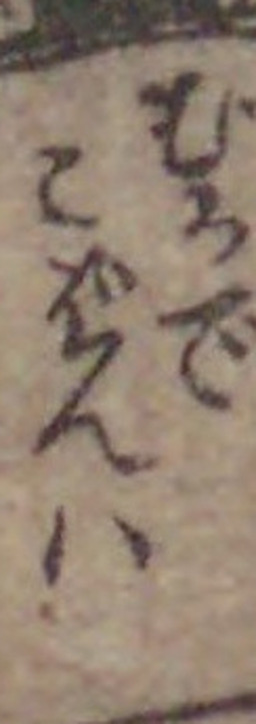こばんは
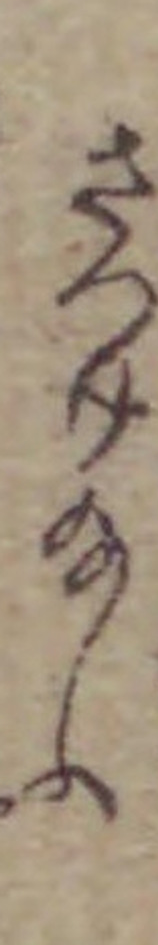さつけ給ふ

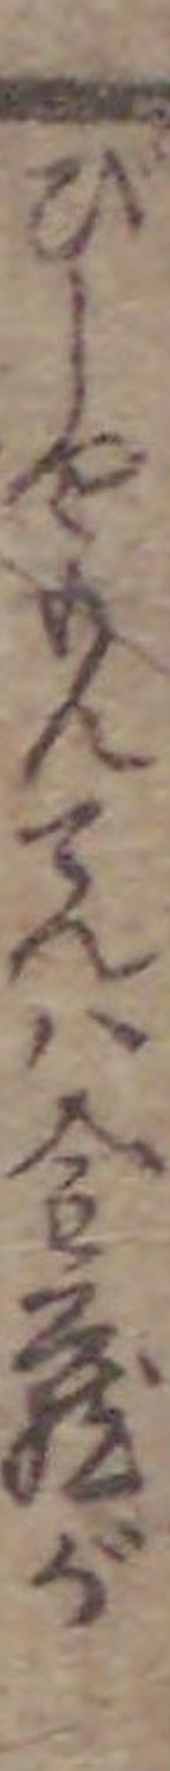びしやもんてんは金蔵が
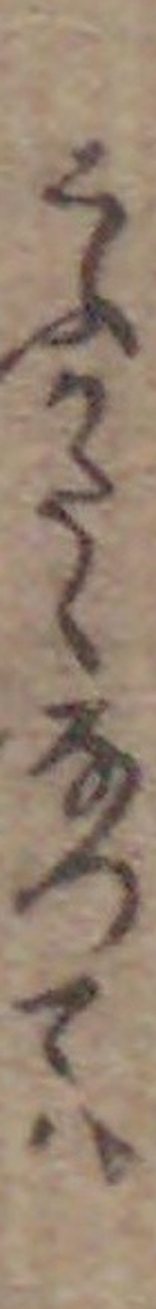こふかたくなつては
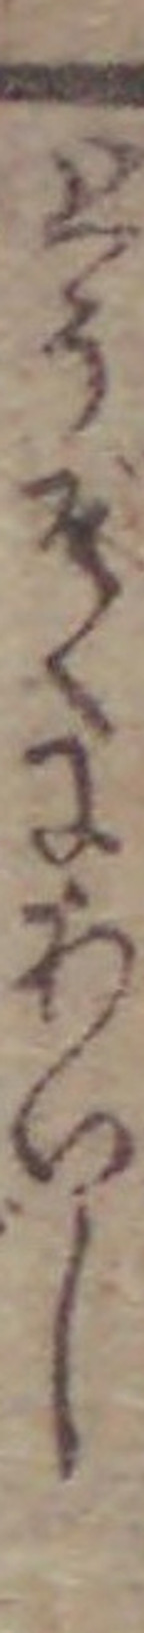とうぞくにあいし
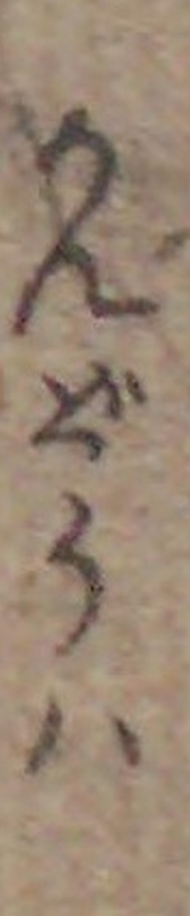かんどうは
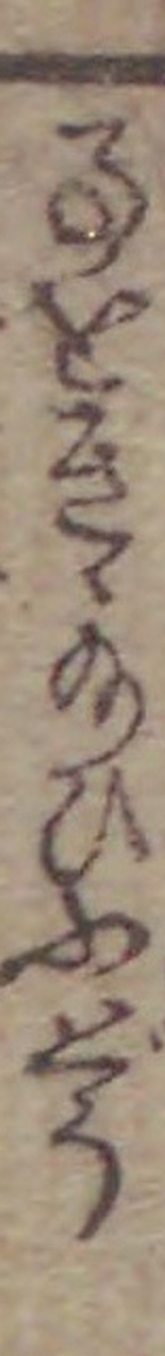事をきゝ給ひふどう
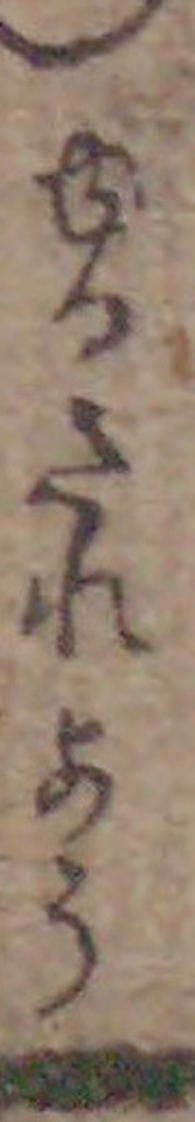ゆるされよう
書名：御代の御寶
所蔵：国立国会図書館 National Diet Library, JAPAN
